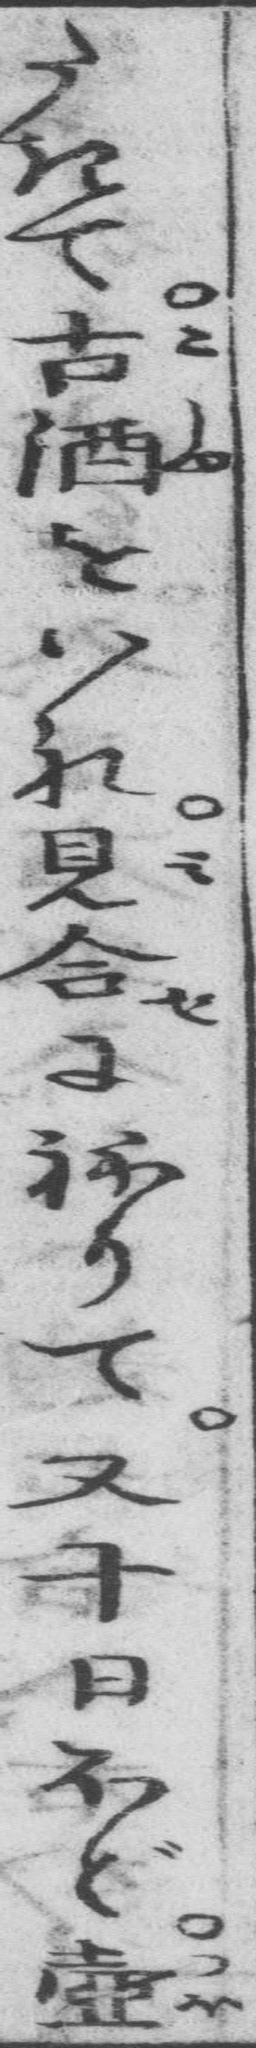たきて。古酒をいれ。見合せにねりて。又十日ほど。壺
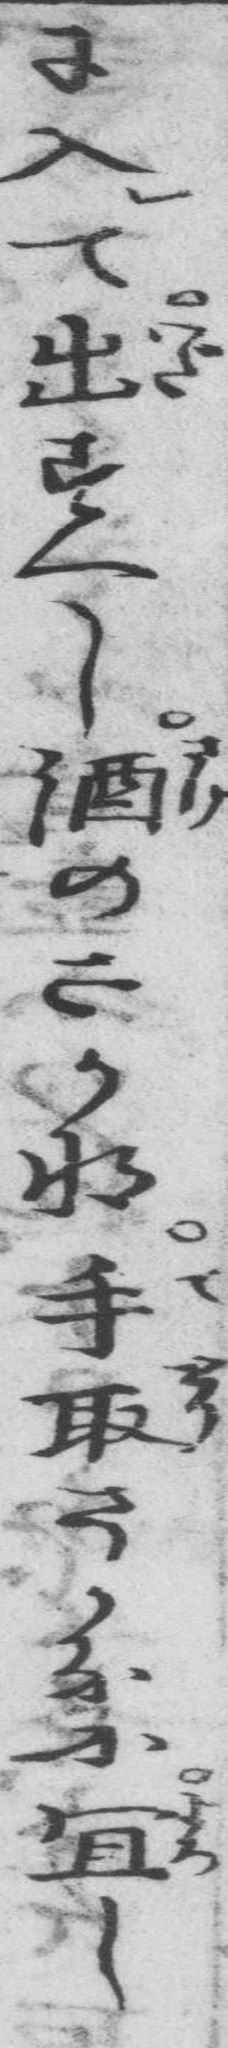に入れて。出すへし。酒のさかな。手取さかなに。宜し
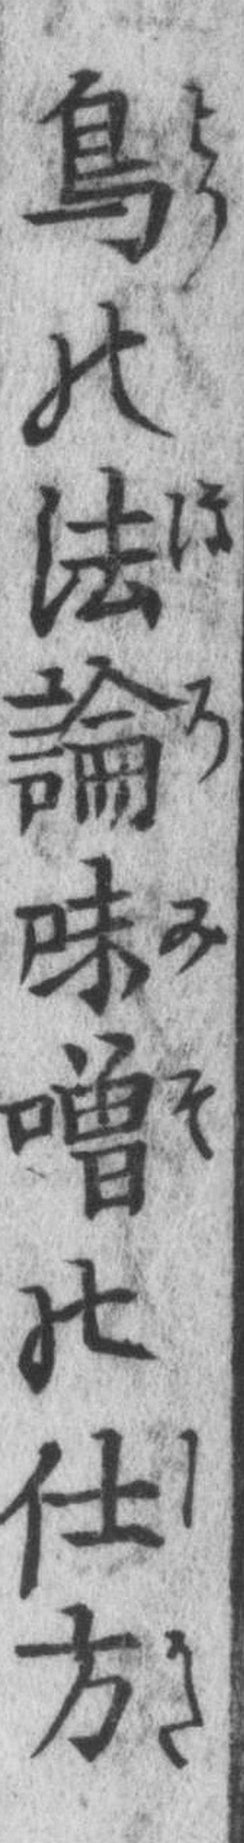鳥の法論味噌の仕方
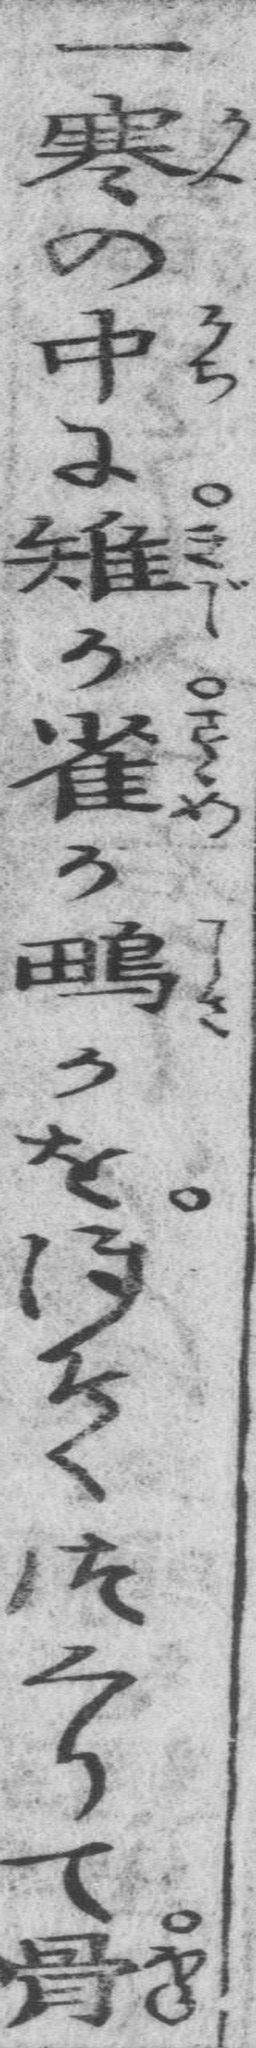一寒の中に。雉か。雀か鴫かを。ほそくつくりて。骨
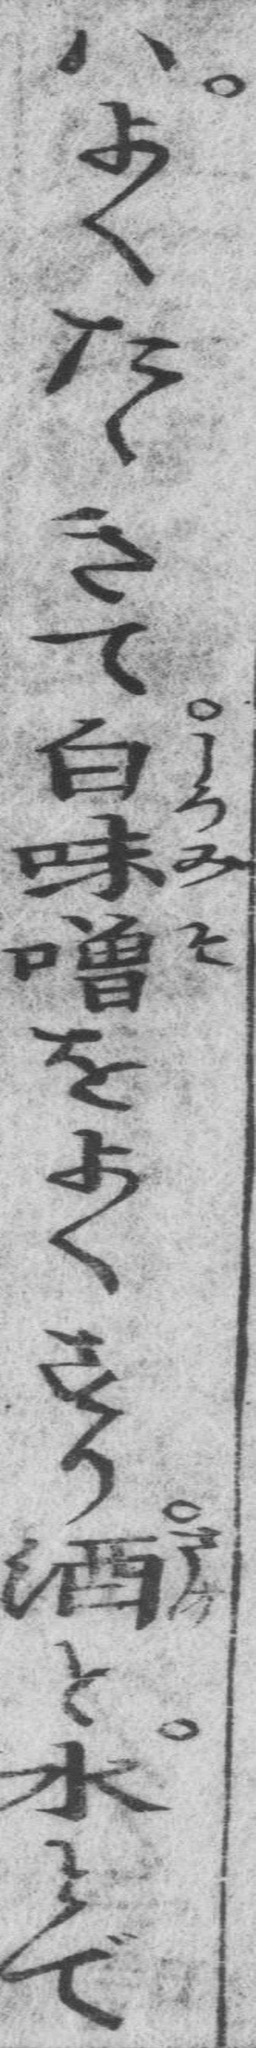は。よくたゝきて。白味噌をよくすり。酒と。水とで
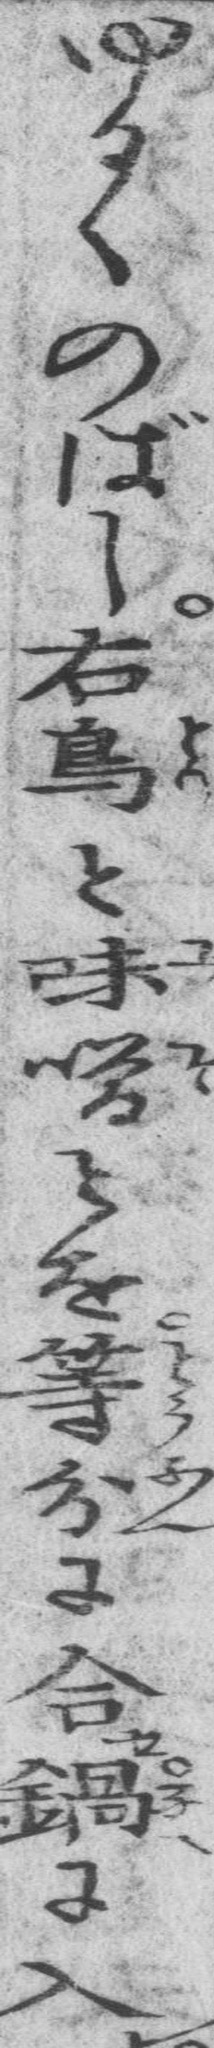ゆるくのばし。右鳥と味噌とを。等分に合せ。鍋に入れ。
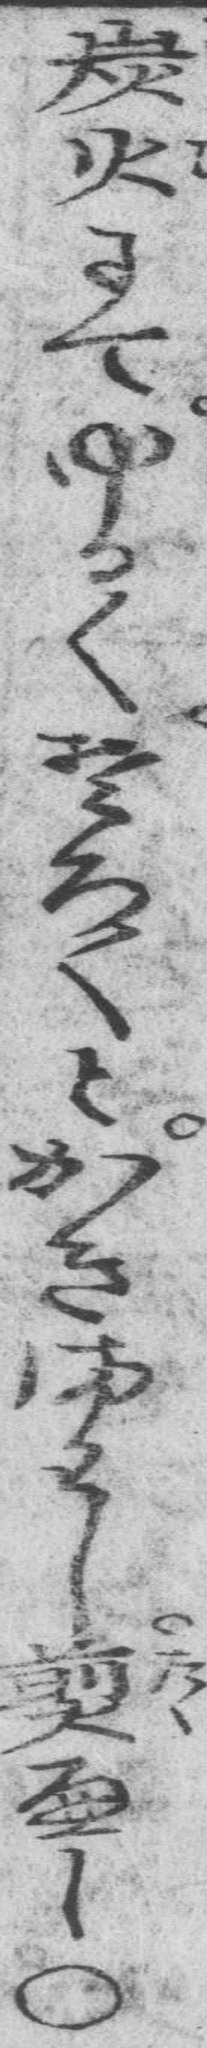炭火にて。ゆる〳〵。そろ〳〵と。かきまわし。煎へし○
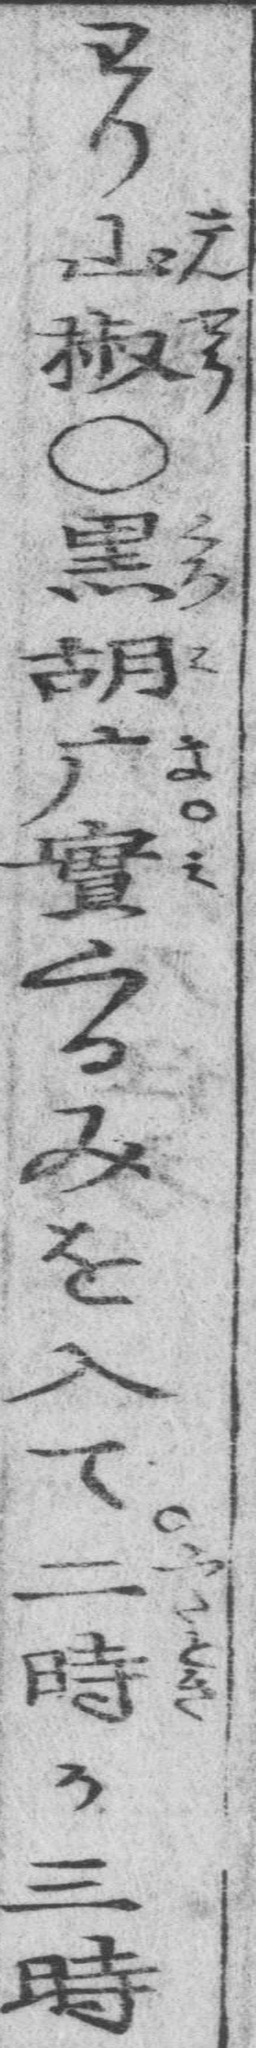わり山椒○黒胡麻。実くるみを入て。二時か三時
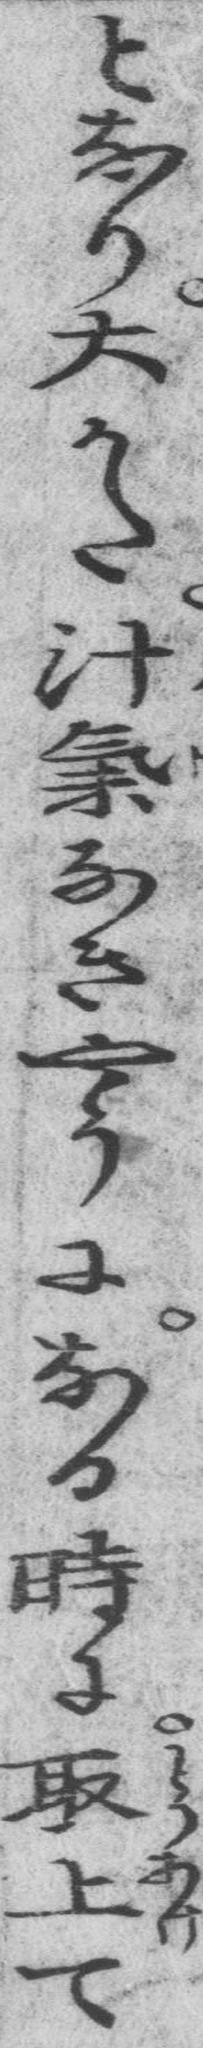となり。大かた。汁気なきやうに。なる時に。取上て
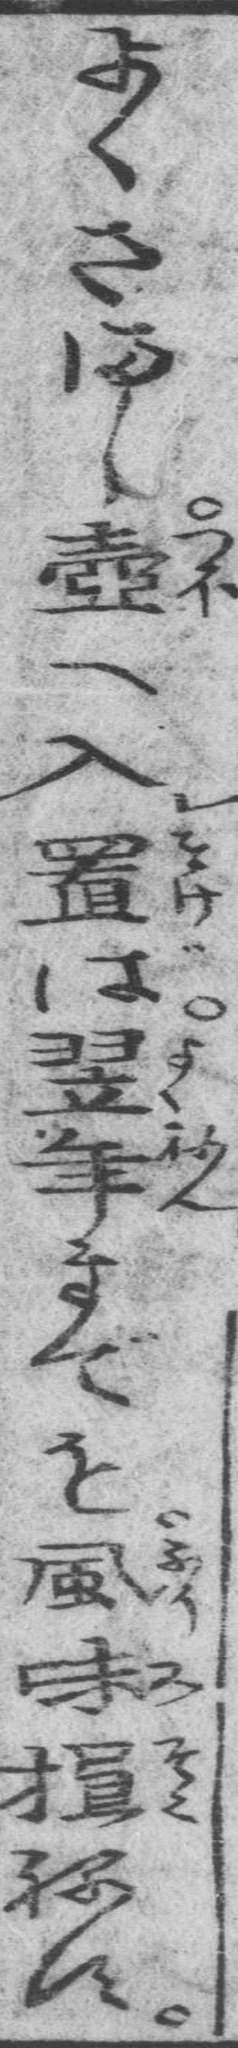よくさまし。壺へ入れ置ば。翌年までも、風味損ねす。

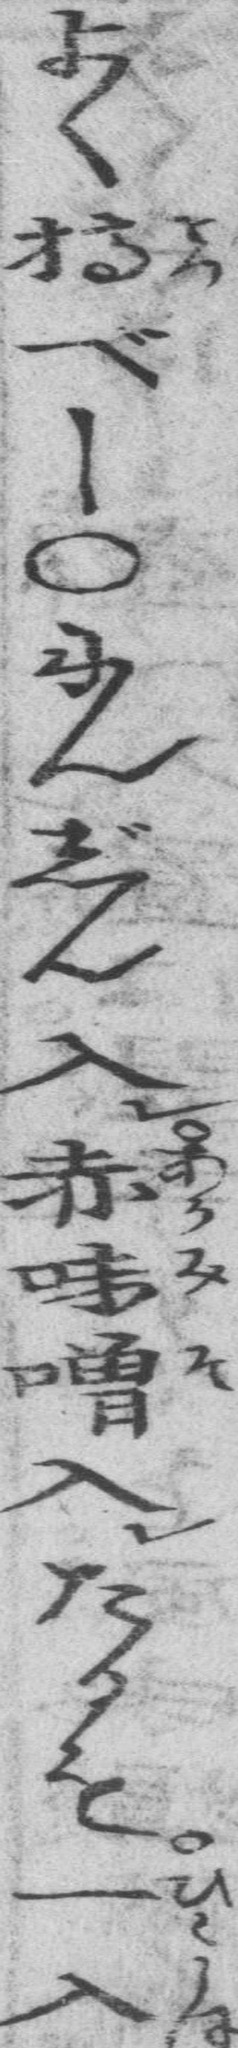よく持べし〇にんじん入れ。赤味噌入れたるも。一入
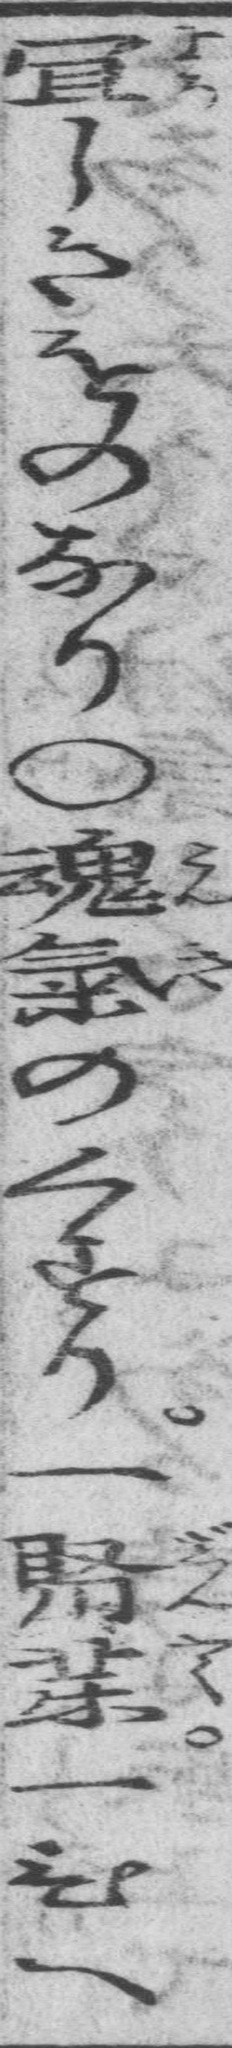宜しきものなり○魂気のくすり。一腎薬。一ひへ
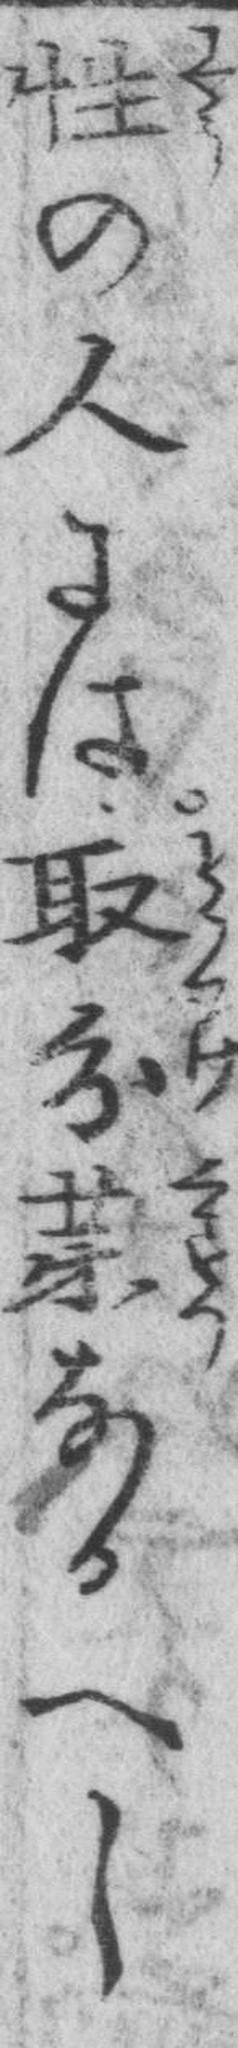性の人には。取分薬なるへし
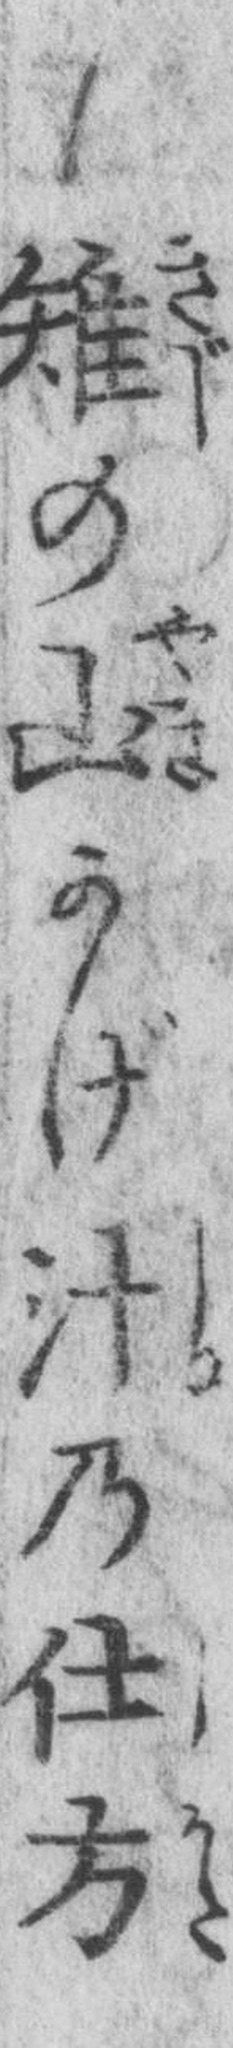雉の山かげ汁の仕方
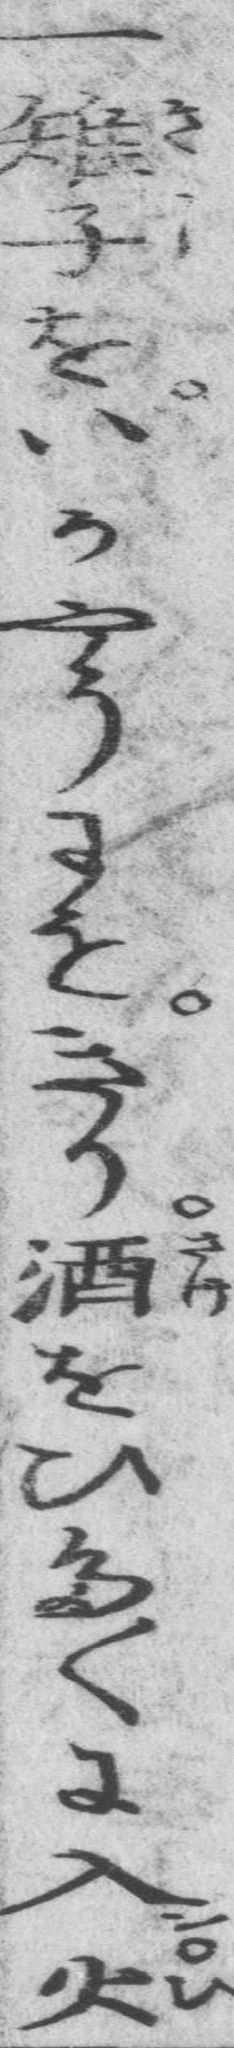一雉子を。いかやうにも。きり。酒をひた〳〵に入れ。火
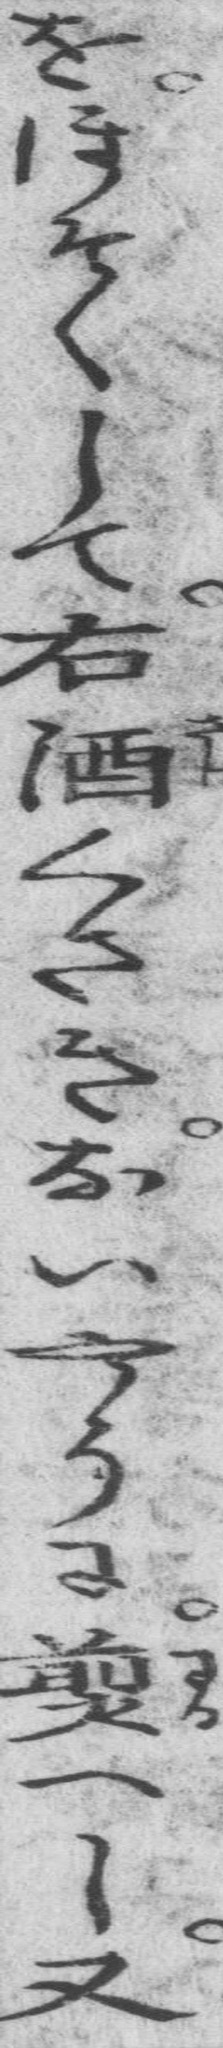を。ほそくして。右酒くさき。ないやうに。煎へし。又
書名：萬寳料理秘密箱
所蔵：大阪府立大学学術情報センター 国文学研究資料館
